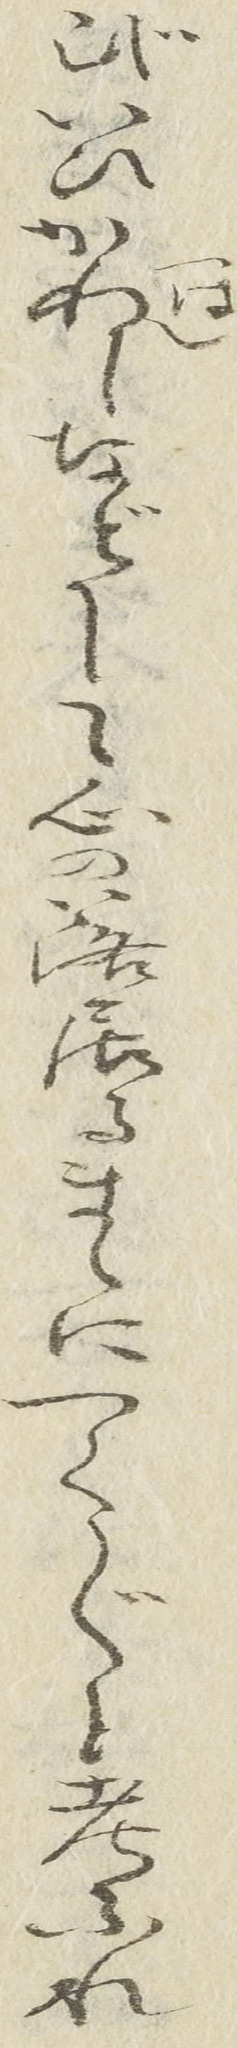びいひかわしなどして心の落居るまゝにつく〴〵と考ふれ
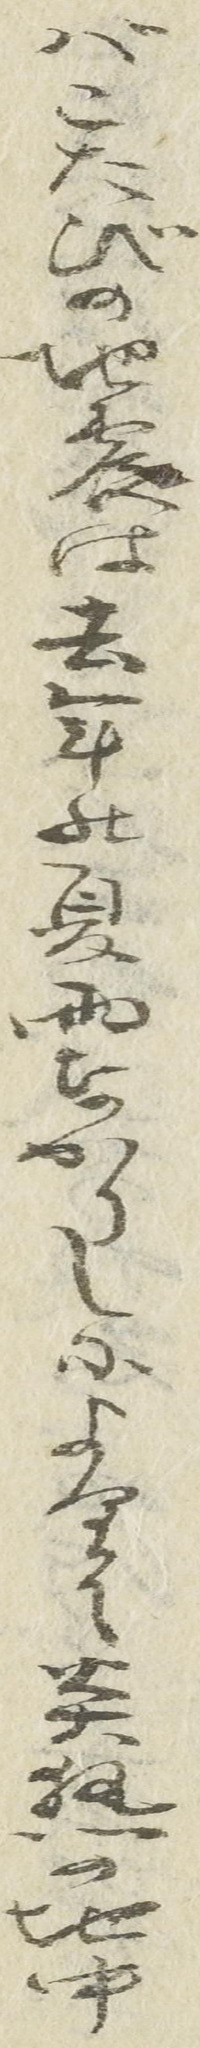バこたびの地震は去年の夏雨なかりしによりて炎熱の地中
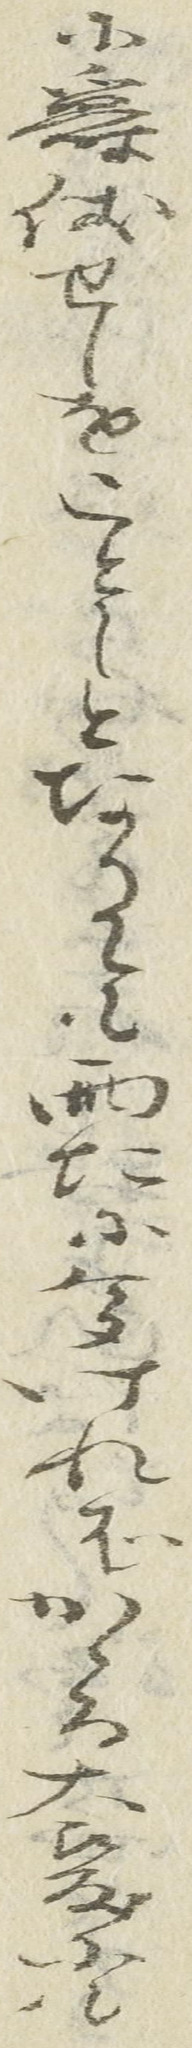に爵伏せしをことしとなりても雨たに多ければかゝる大変にも
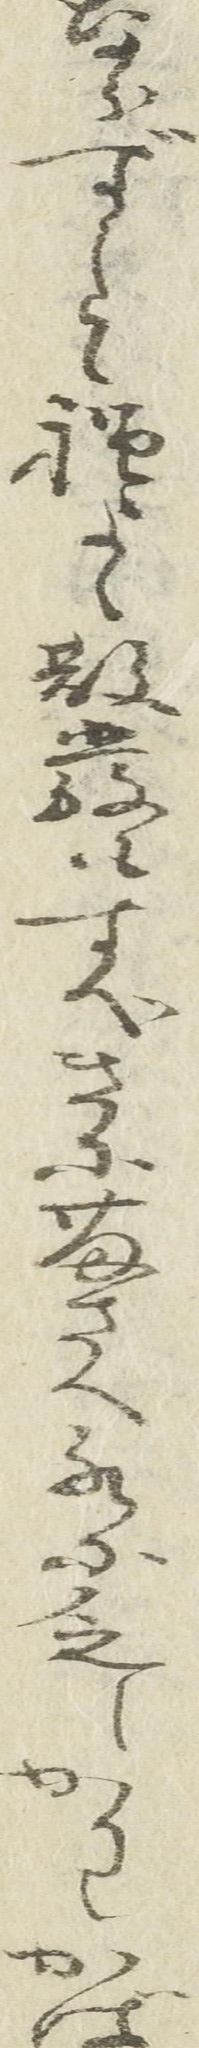ならずして程よく散發もすべきに苗さへ水に乏しかりしかば
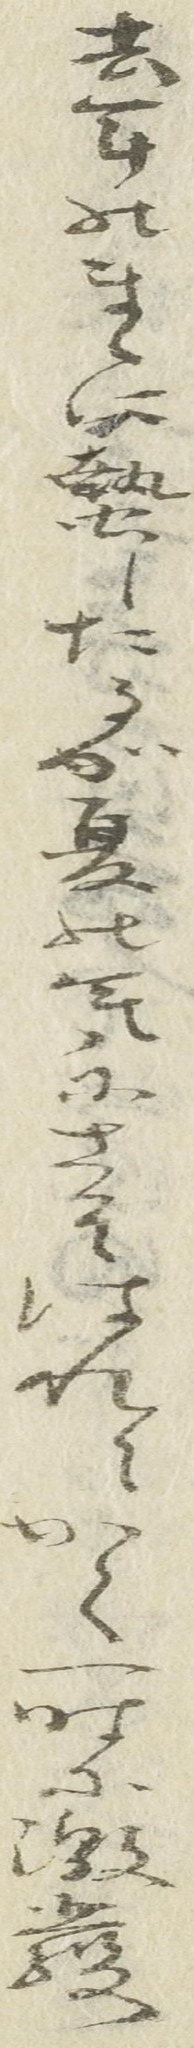去年のまゝに蟄したるが夏の気にさそはれてかく一時に激發
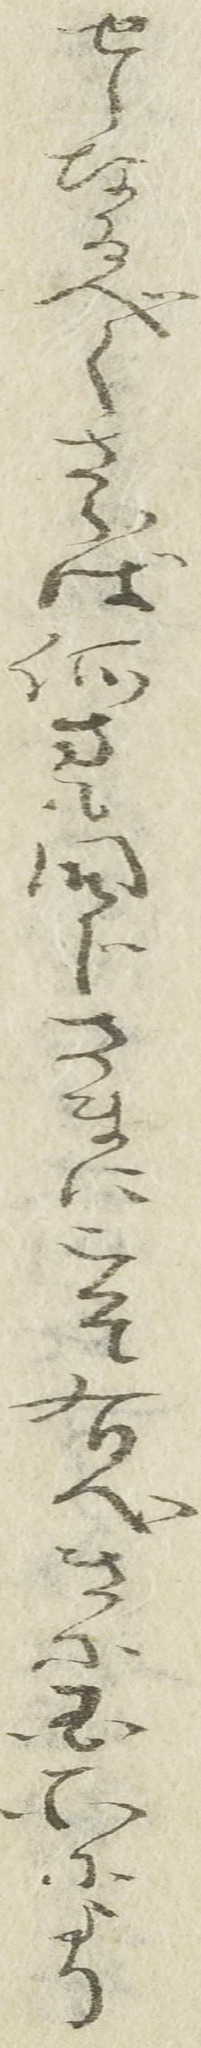せしなるべしさらば何方も同じさまにこそ有べきに国所により
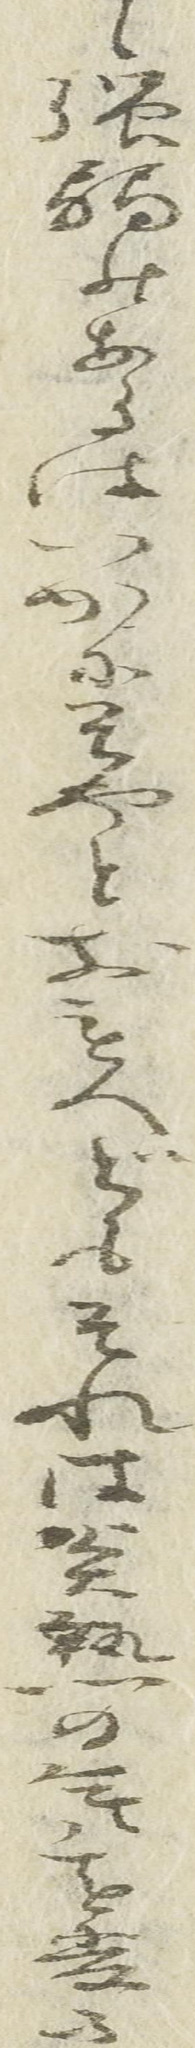て強弱のあるはいかにそやとおもへどもそれは炎熱の気を敷？而
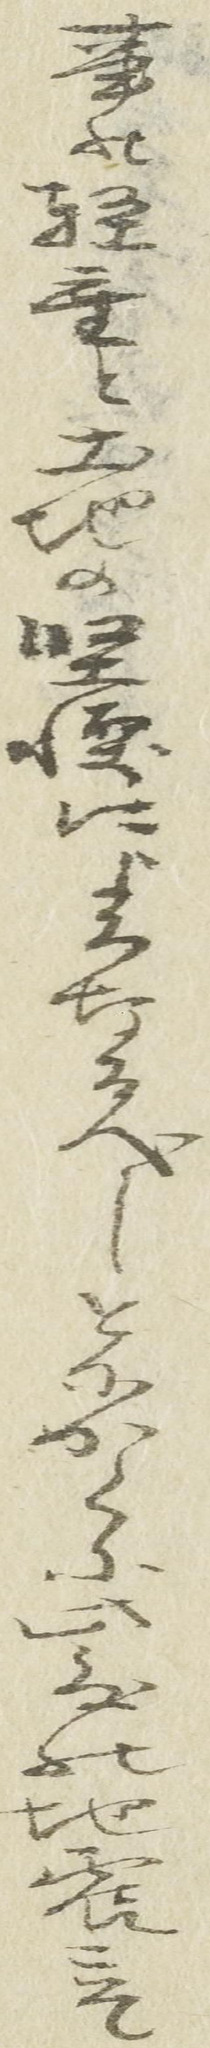事の軽重と土地の堅懦によるなるべしとにかくに此度の地震こそ
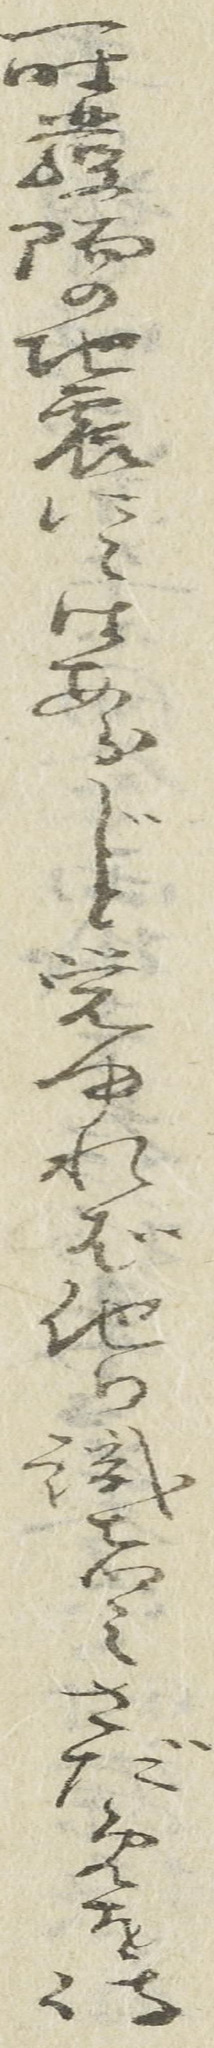一時發陽の地震にてはあらじと覚ゆれば他の識者之さだめを待
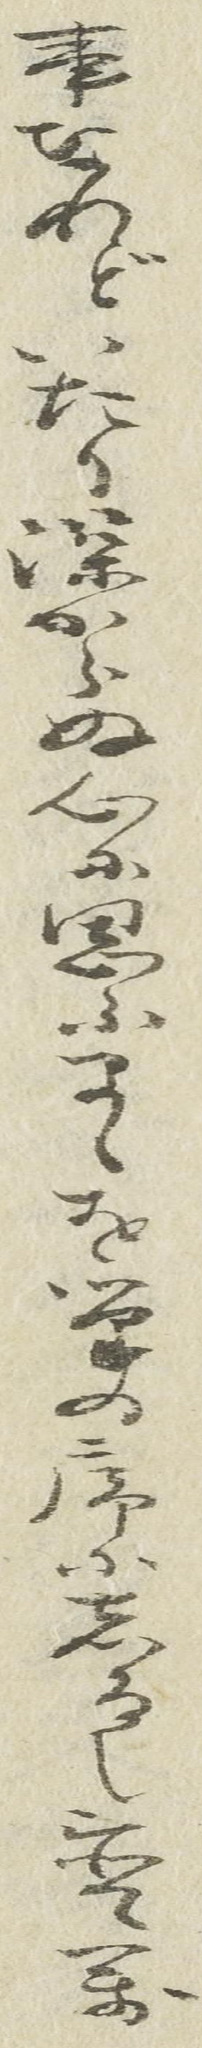事なれどいたり深からぬ心に思ふまゝを筆の序にしるし置て万
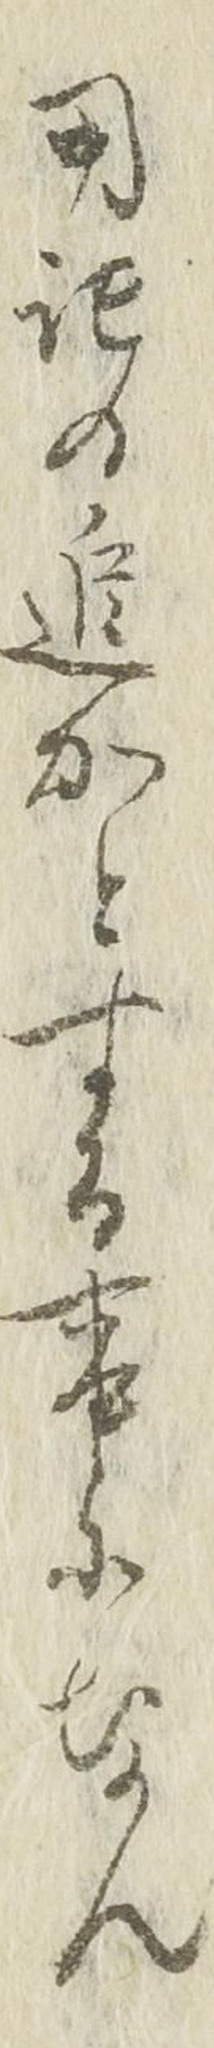用記の追加とする事になん
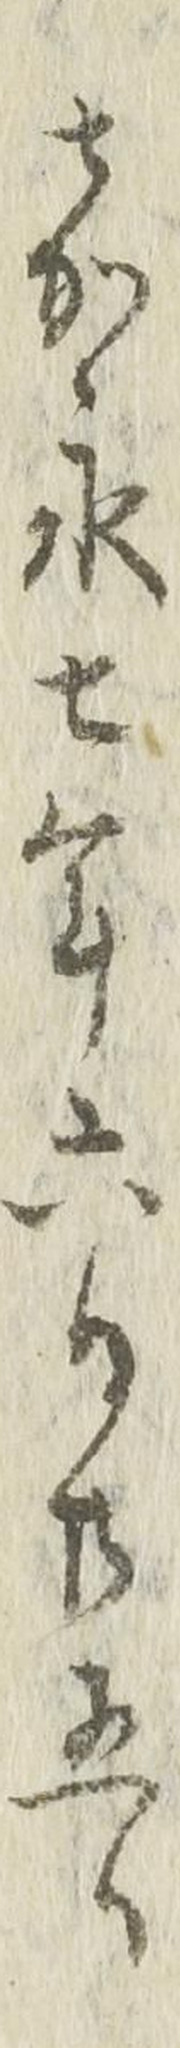嘉永七年六月廿五日

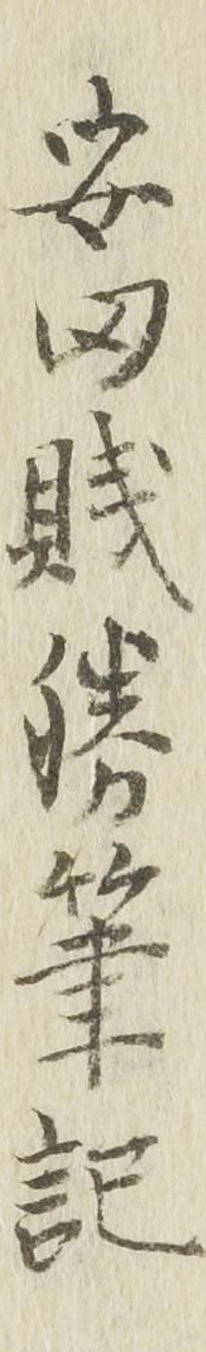安田賤勝筆記
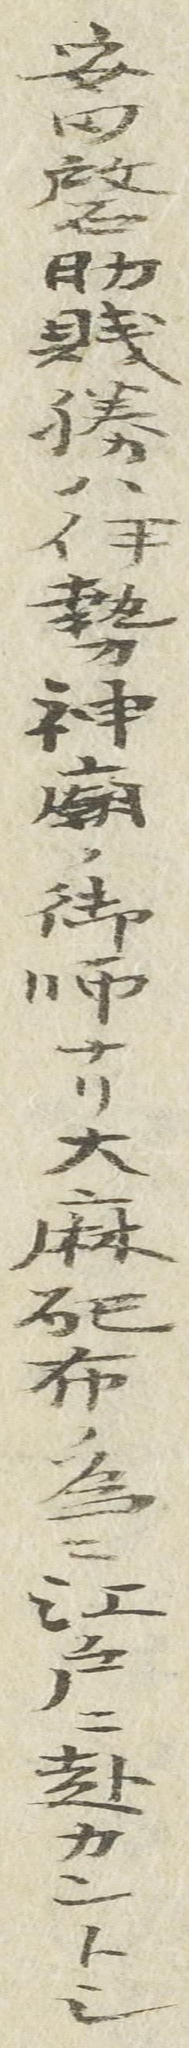安田啓？助賤勝ハ伊勢神廟ノ御師ナリ大麻配布ノ為ニ江戸ニ赴カントシ
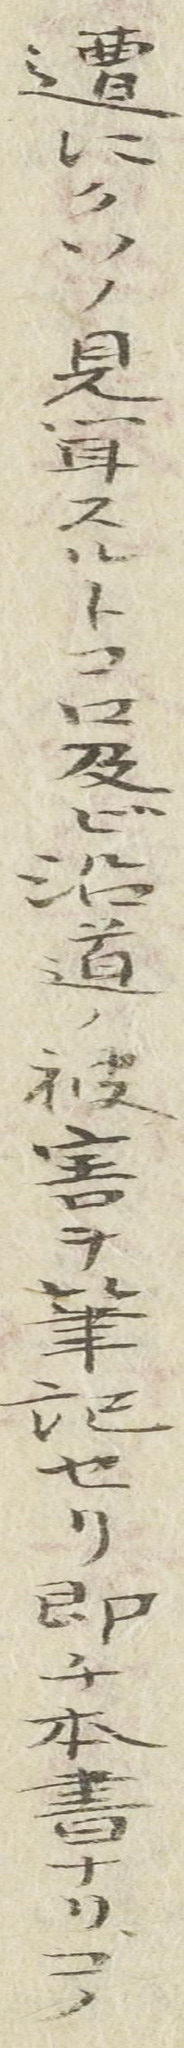遭にクソノ見聞スルトコロ及ビ沿道ノ被害ヲ筆記セリ即チ本書ナリコノ
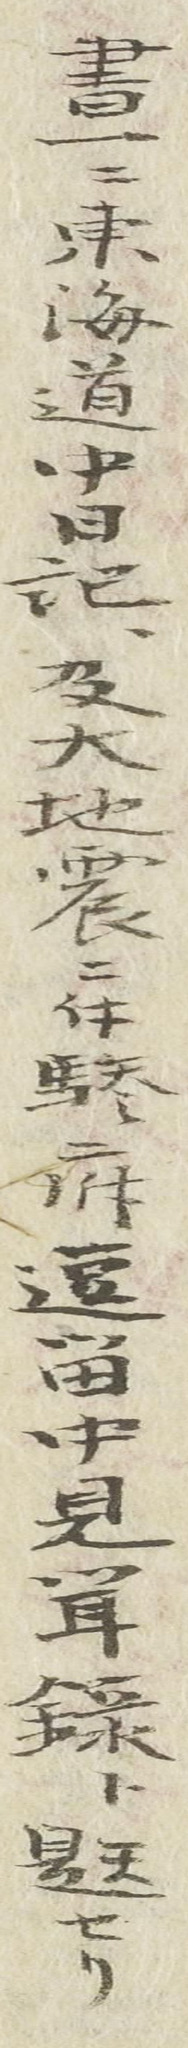書一ニ東海道中日記、及大地震ニ付駿府逗留中見聞録ト題セリ
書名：地震前兆集　全
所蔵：東京大学地震研究所図書室 Earthquake Research Institute Library, The University of Tokyo, JAPAN
